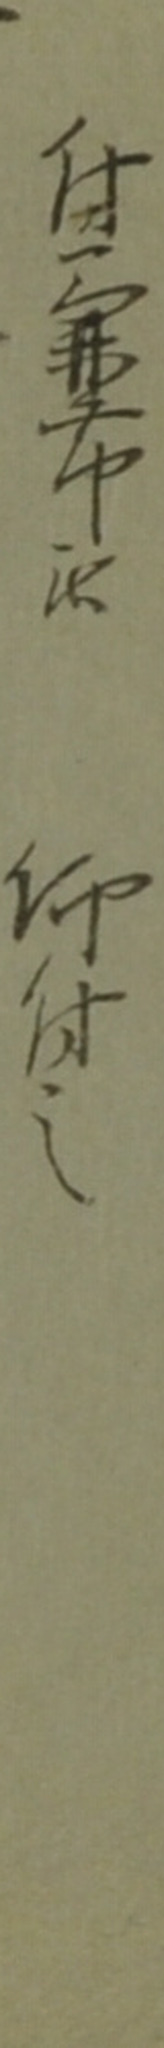付兼帯被仰付之
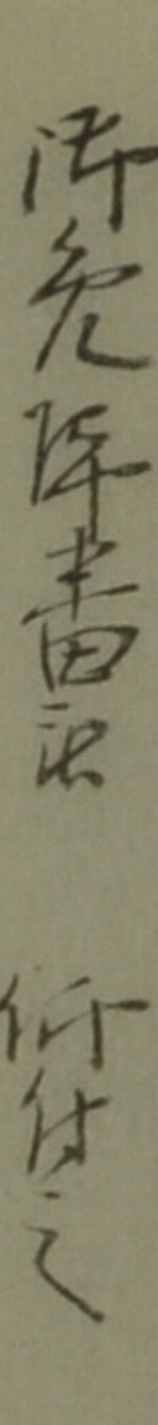御免帰番被仰付之
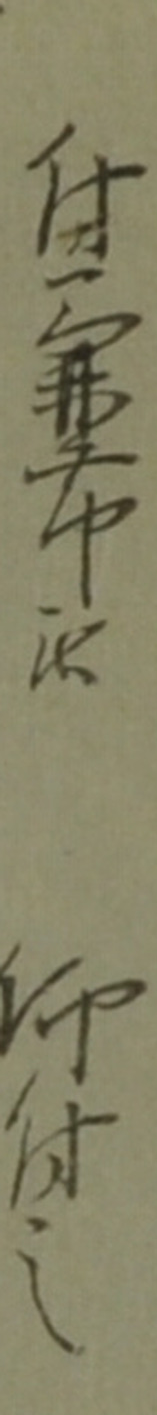付兼帯被仰付之
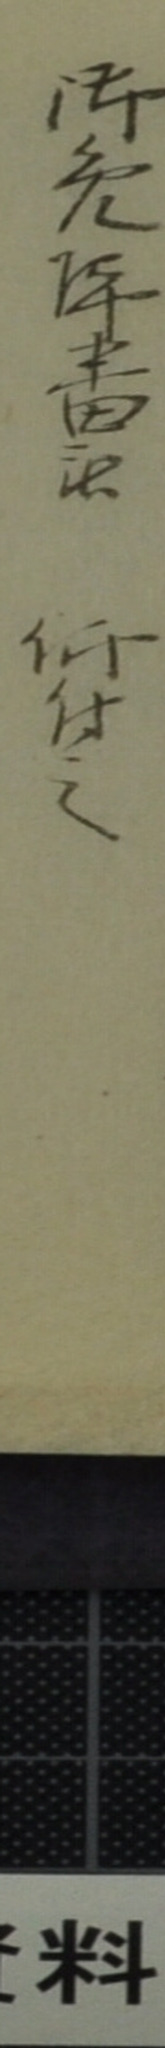御免帰番被仰付之
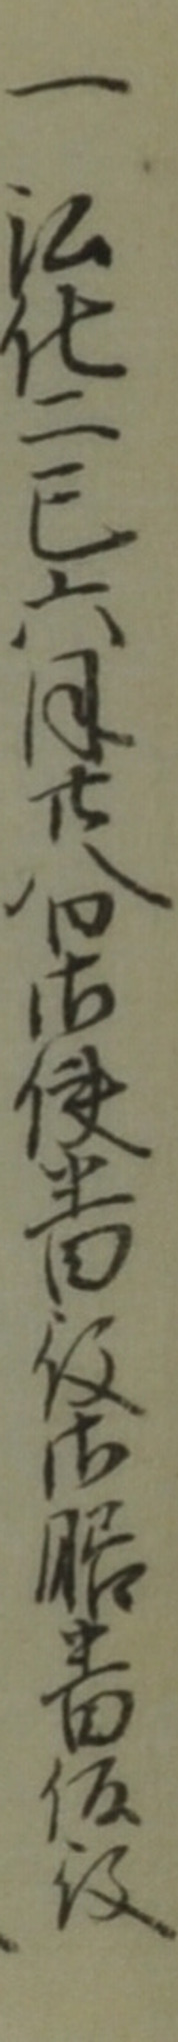一弘化二巳六月廿八日御使番役御膳番仮役
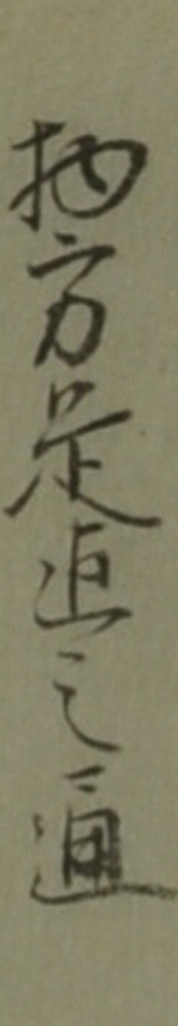物方是迄之通
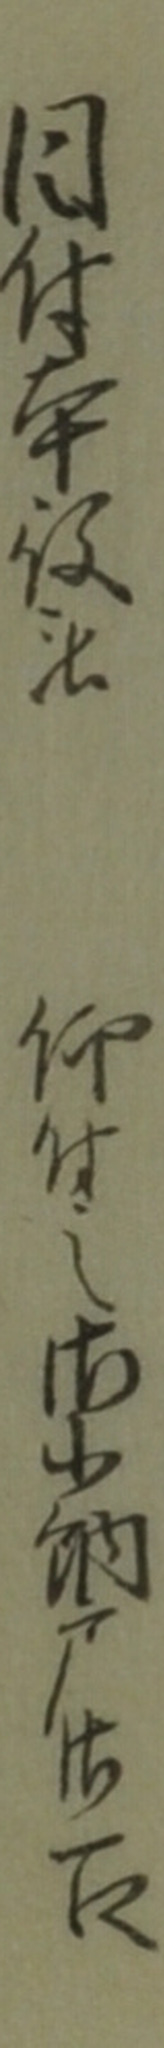目付本役被仰付之御小納戸御召
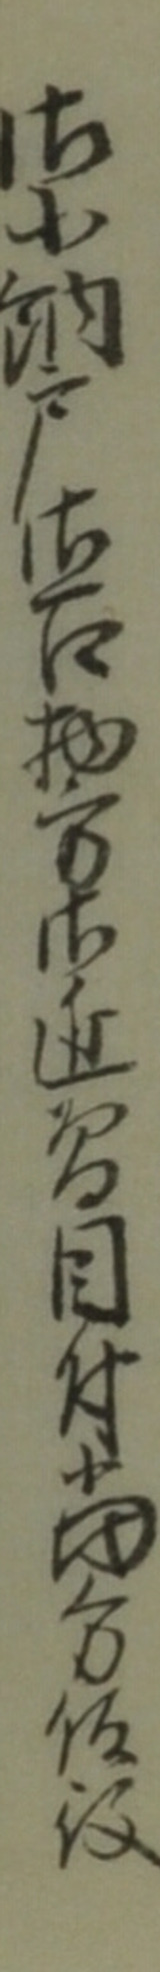御小納戸御召物方御近習目付当分仮役
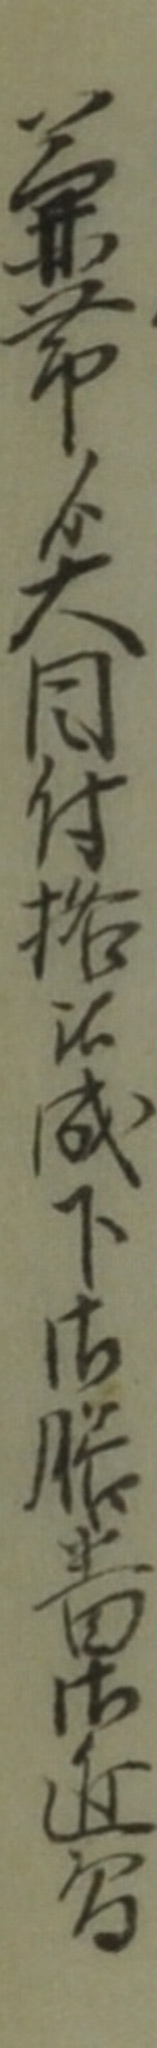兼帯ゟ大目付格被成下御膳番御近習
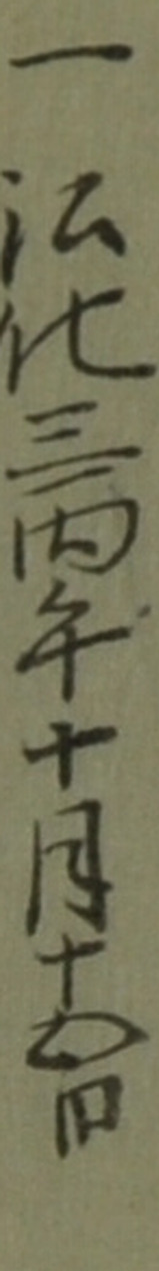一弘化三丙午十月十五日
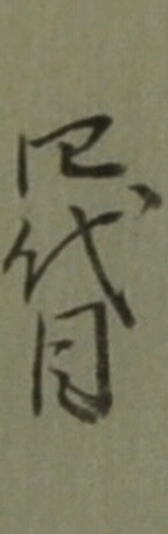四代目
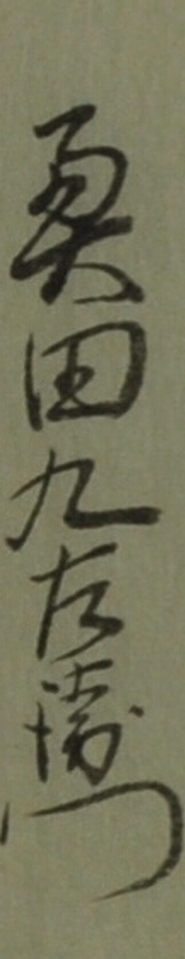奥田九左衛門
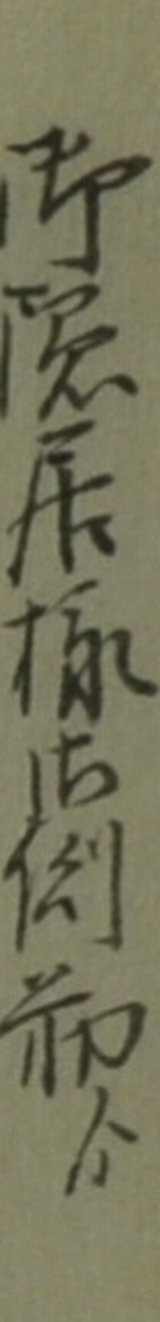御隠居様御側勤ゟ
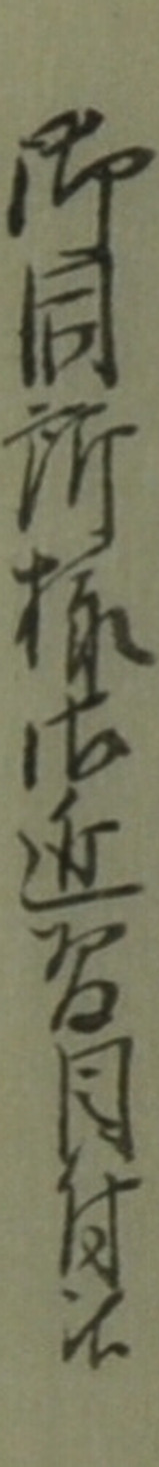御同所様御近習目付被
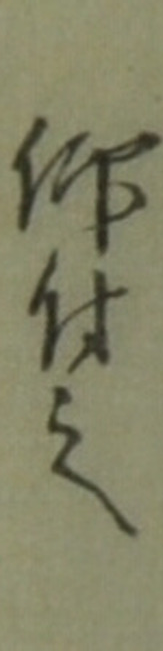仰付之

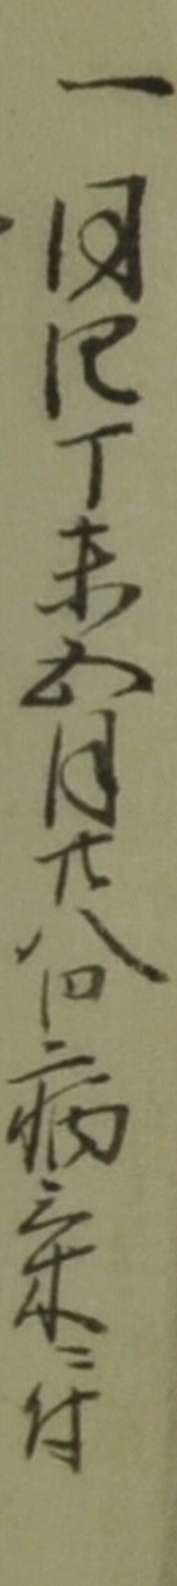一同四丁未五月廿八日病気ニ付
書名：諸御役代々録（四）
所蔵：伊那市立高遠町図書館・合同会社AMANE
